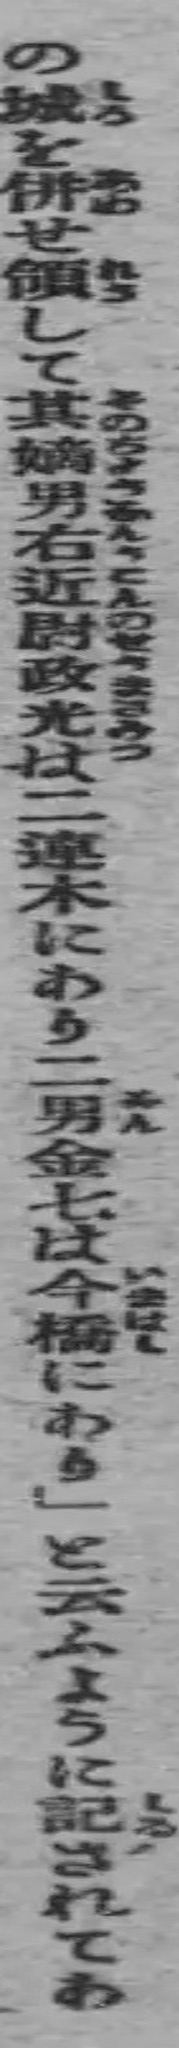の城を併せ領して其嫡男右近尉政光は二連木にあり二男金七は今橋にあり」と云ふように記されてあ
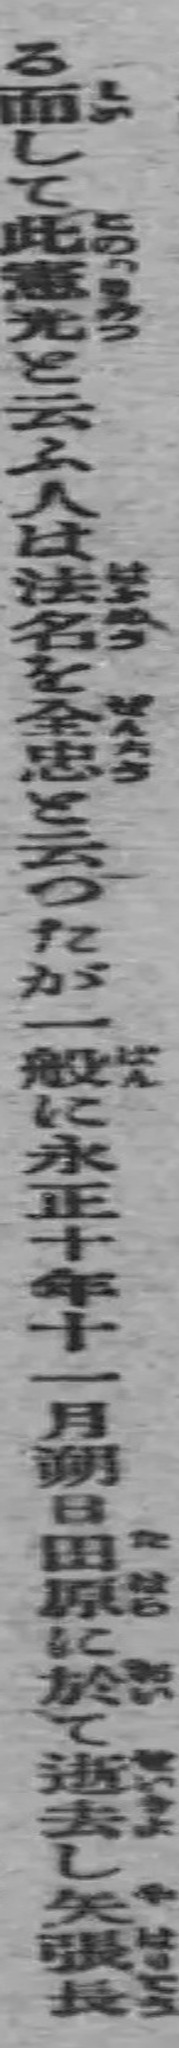る而して此憲光と云ふ人は法名を全忠と云つたが一般に永正十年十一月朔日田原に於て逝去し矢張長
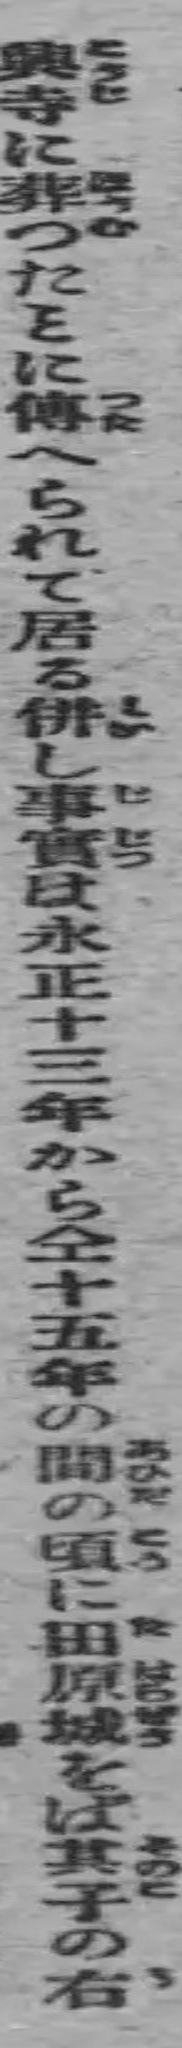戸田政光興寺に葬つたことに伝へられて居る併し事実は永正十三年から仝十五年の間の頃に田原城をば其子の右
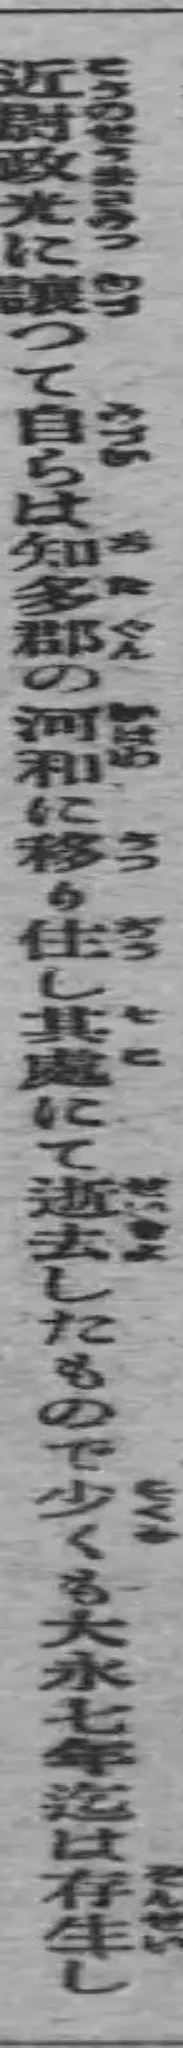近尉政光に譲つて自らは知多郡の河和に移り住し其処にて逝去したもので少くも大永七年迄は存生し
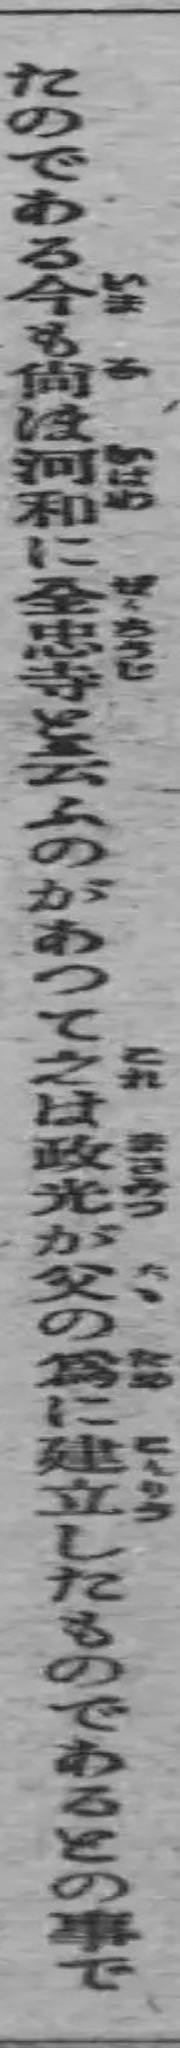たのである今も尚ほ河和に全忠寺と云ふのがあつて之は政光が父の為に建立したものであるとの事で
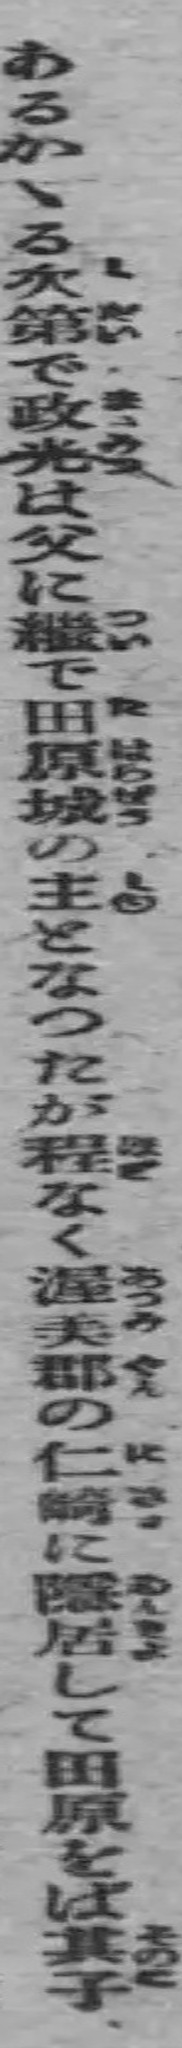あるかゝる次第で政光は父に継で田原城の主となつたが程なく渥美郡の仁崎に隠居して田原をば其子
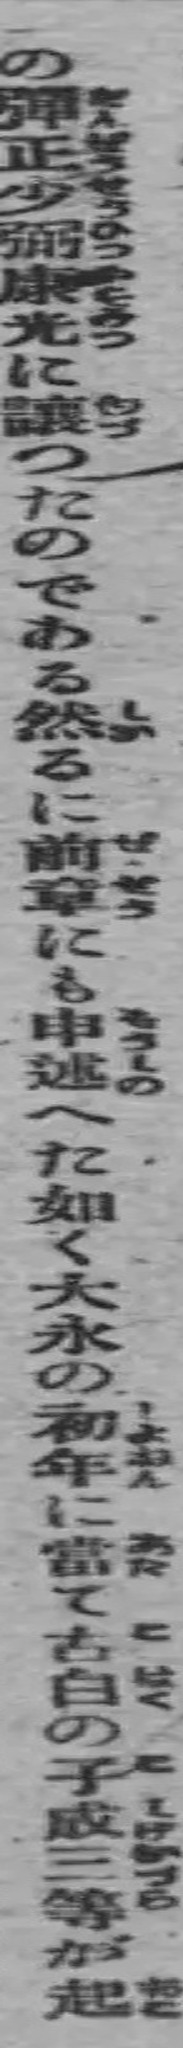戸田康光の弾正小弼康光に譲つたのである然るに前章にも申述へた如く大永の初年に当て古白の子成三等が起
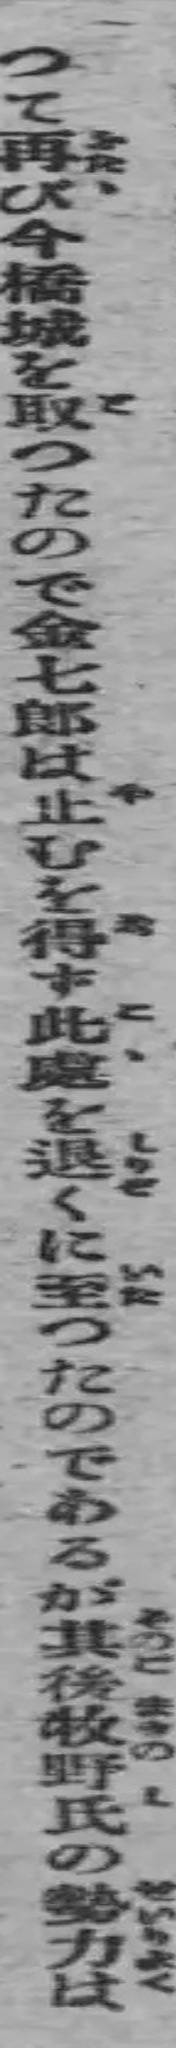つて再び今橋城を取つたので金七郎は止むを得ず此処を退くに至つたのであるが其後牧野氏の勢力は
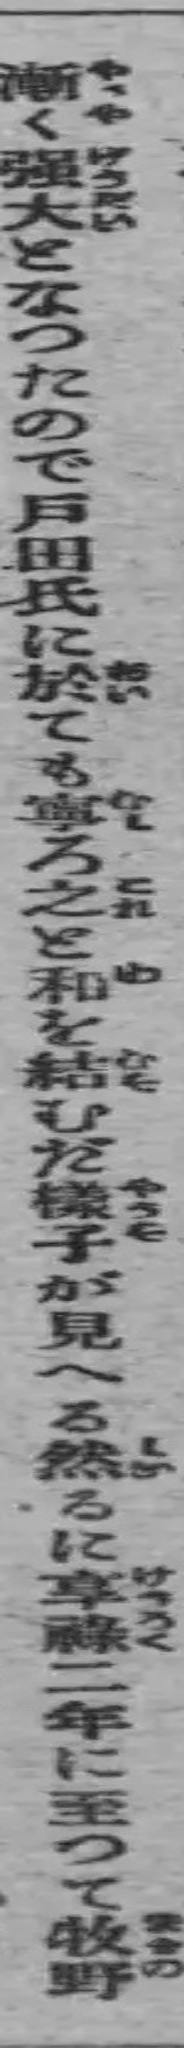漸く強大となつたので戸田氏に於ても寧ろ之と和を結むだ様子が見へる然るに享禄二年に至つて牧野
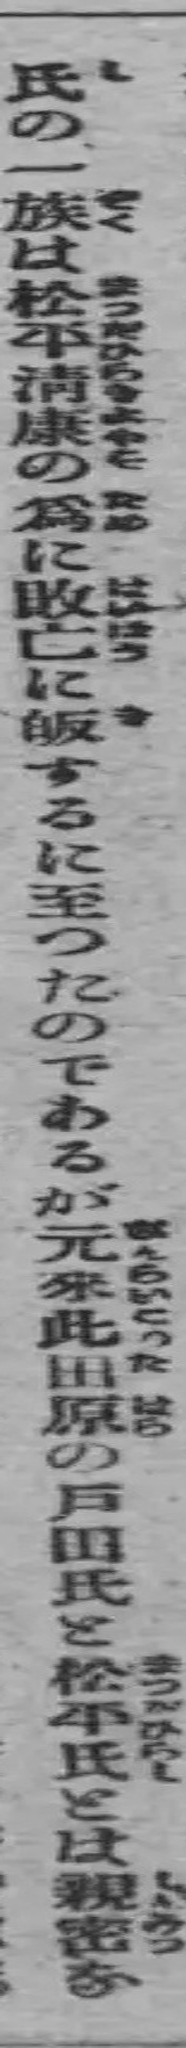氏の一族は松平清康の為に敗亡に皈するに至つたのであるが元来此田原の戸田氏と松平氏とは親密な
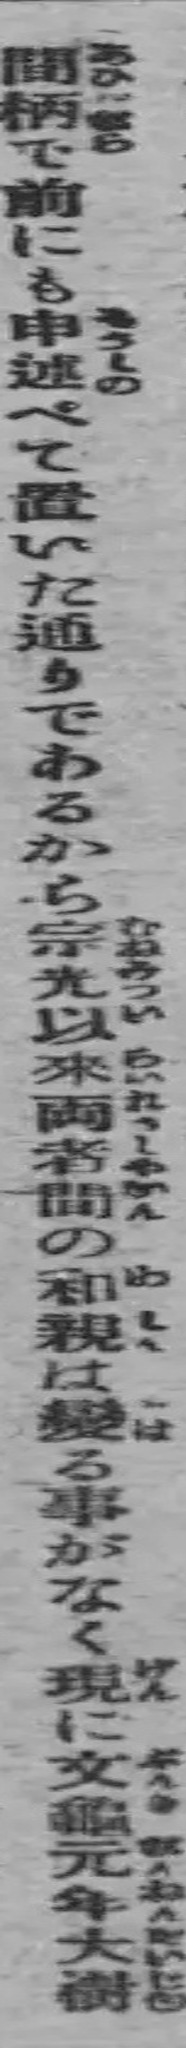間柄で前にも申述べて置いた通りであるから宗光以来両者間の和親は変る事がなく現に文亀元年大樹
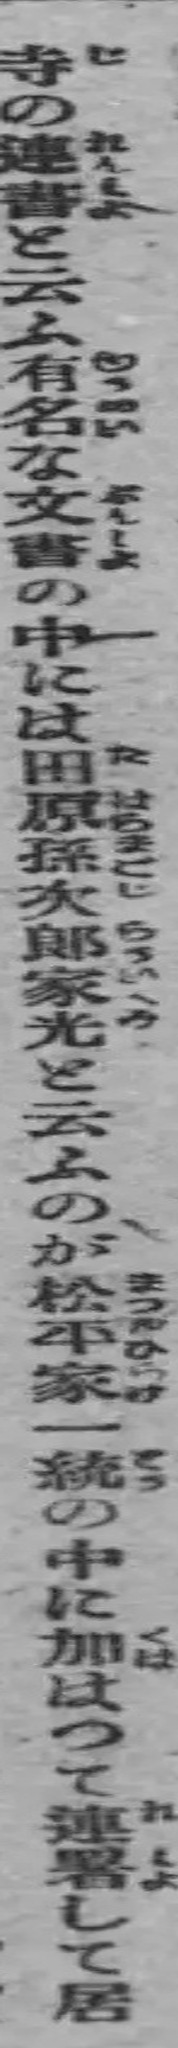寺の連書と云ふ有名な文書の中には田原孫次郎家光と云ふのが松平家一統の中に加はつて連署して居
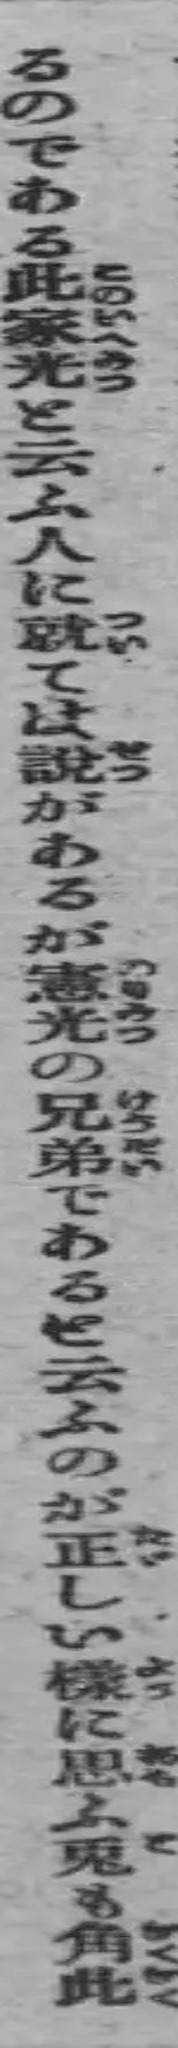るのである此家光と云ふ人に就ては説があるが憲光の兄弟であると云ふのが正しい様に思ふ兎に角此
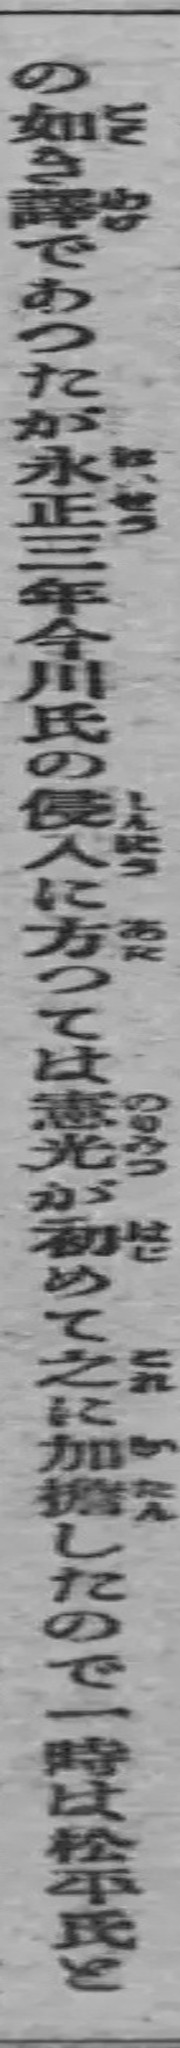の如き訳であつたが永正三年今川氏の侵入に方つては憲光が初めて之に加担したので一時は松平氏と
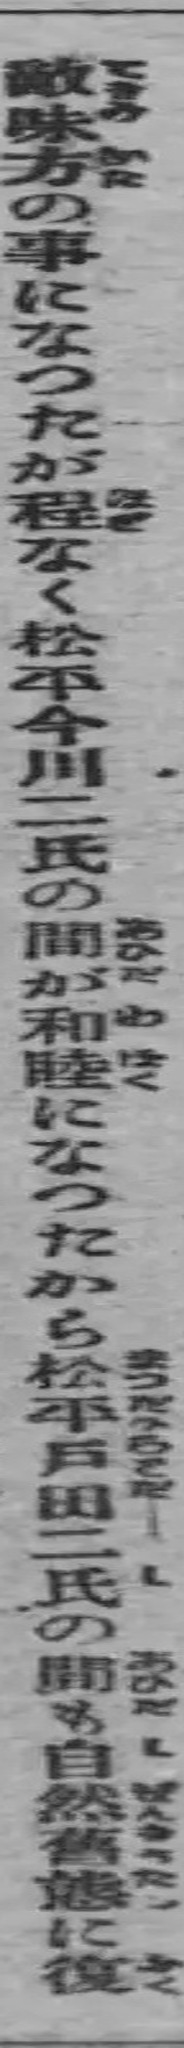敵味方の事になつたが程なく松平今川二氏の間が和睦になつたから松平戸田二氏の間も自然旧態に復
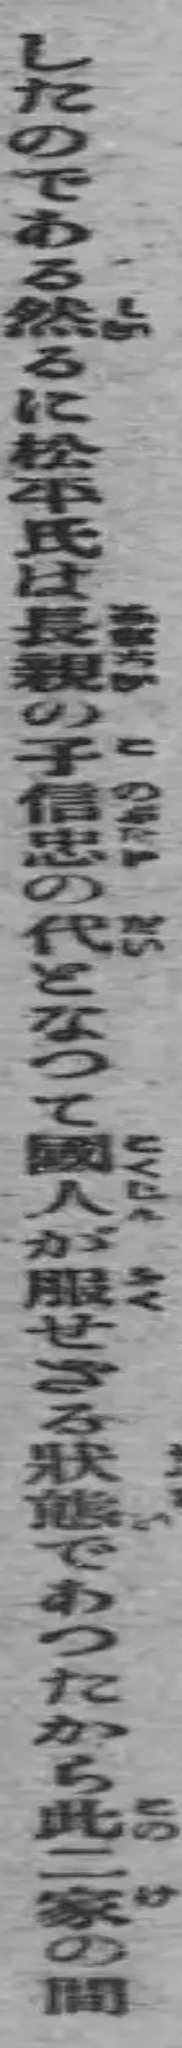したのである然るに松平氏は長親の子信忠の代となつて国人が服せざる状態であつたから此二家の間
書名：豊橋市史談
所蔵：国立国会図書館 National Diet Library, JAPAN
